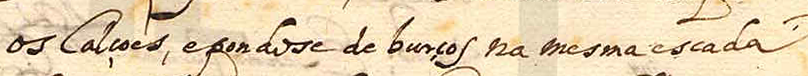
os Calções, e pondose de burços na mesma escada
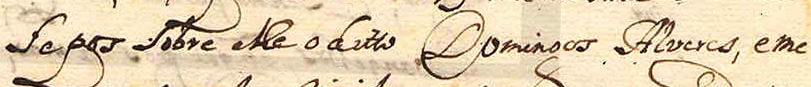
se pos sobre elle o ditto Domingos Alveres, e me
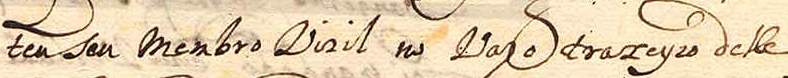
teu seu membro Viril no Vazo trazeyro delle
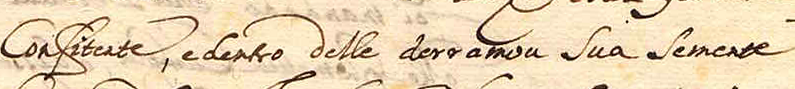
Confitente, e dentro delle derramou sua semente
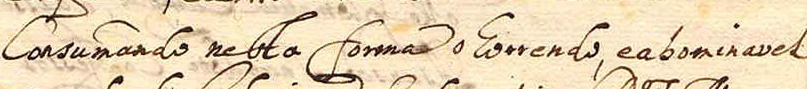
Consumando nesta forma o horrendo, e abominavel
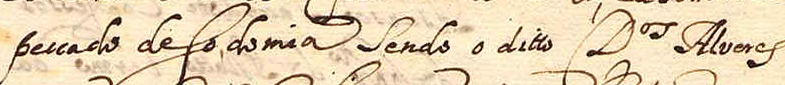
peccado de Sodomia Sendo o ditto D.os Alveres
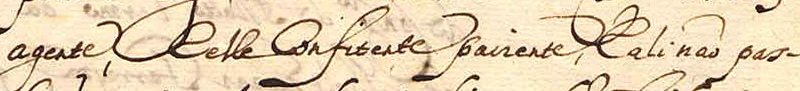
agente, E elle Confitente paciente, E ali naõ pas
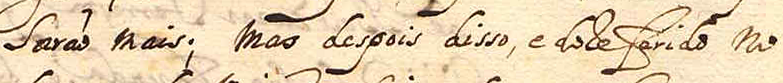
Saraõ mais; mas despois disso, e do Referido no
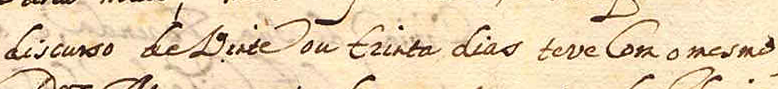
discurso de Vinte ou trinta dias teve Com o mesmo
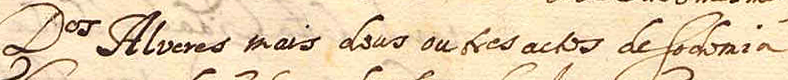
Dos Alveres mais dous ou tres actos de sodomia
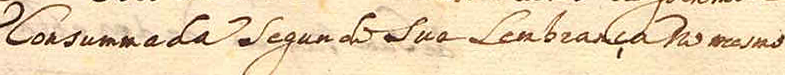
Consummada segundo sua Lembrança no mesmo
